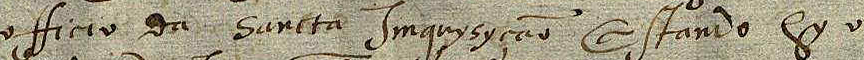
officio da Sancta Jmquysyção Estando hy o
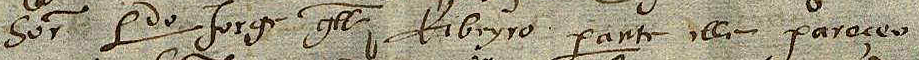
So̅r Ldo Jorge g̅llz Ribeyro ꝑante elle pareçeo
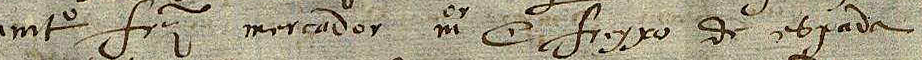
amto frz̄ mercador mor e̅ freyxo de espada
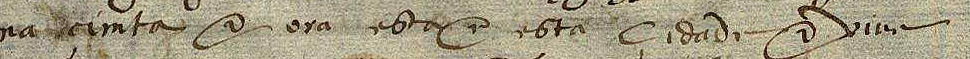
na çimta e ora esta e̅ esta Çidade e viue
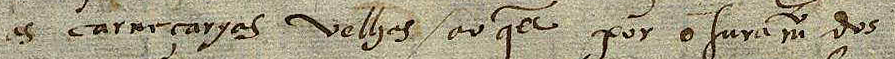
as carneçaryas velhas / ao q̅ll por o Juramto dos
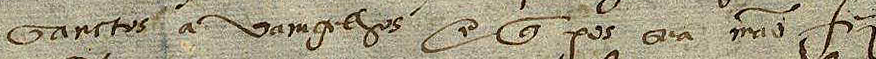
sanctos avamgelhos e̅ q̅ pos sua mão fez
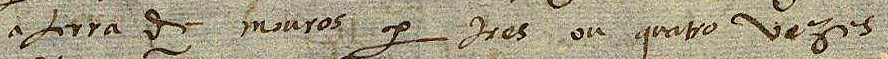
a terra de mouros ꝑ tres ou quatro vezes
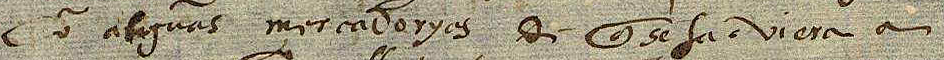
co̅ algu̅as mercadoryas de q̅ se ja o viera a
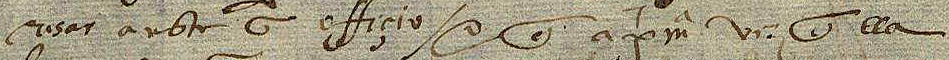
cusar a este sto offiçio / e q̅ a pima vez q̅ lla
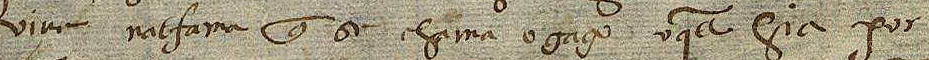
viue nalfama q̅ se chama o gago o q̅ll hia por
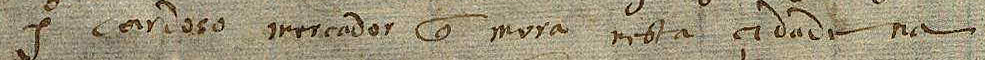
po cardoso mercador q̅ mora nesta çidade na
